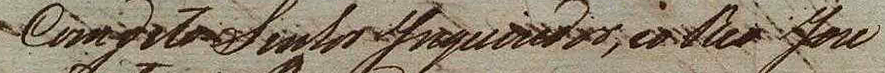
com o dito Senhor Inquizidor, e o Reo Joze
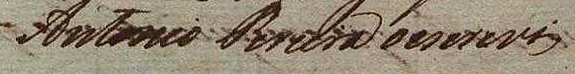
Antonio Pereira o escrevi
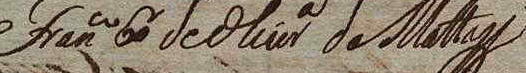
Fran.co X.r de Oliv.a da Matta
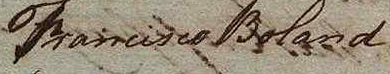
Francisco Boland
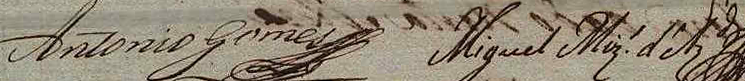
Antonio Gomes Miguel Miz̄ d'Az.do
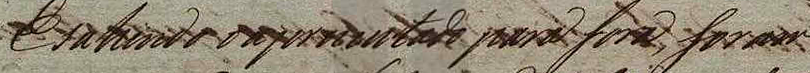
E sahindo o aprezentado para fora, foram
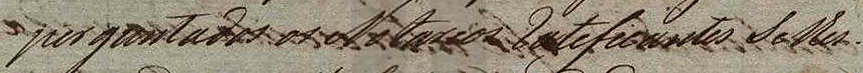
perguntados os Notarios Rateficantes se lhes
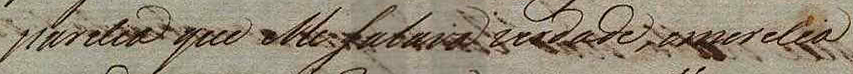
parecia que elle falava verdade, e merecia
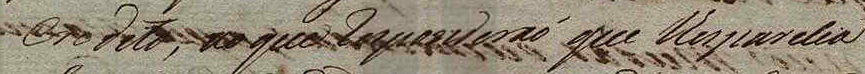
credito, ao que Responderaõ que lhe parecia
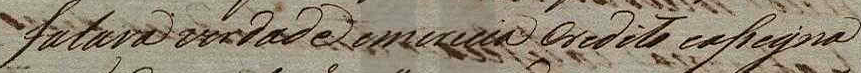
falava verdade e merecia credito e assegna
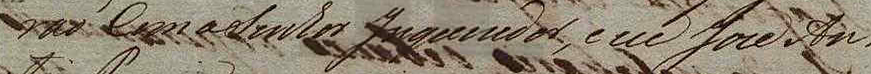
raõ com o Senhor Inquizidor, e eu Ioze An
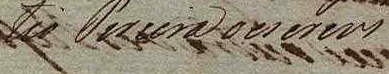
tonio Pereira o escrevi
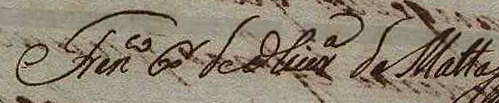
Fran.co X.r de Oliv.a da Matta
